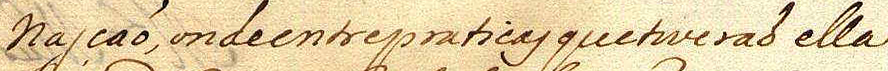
nasçaõ, onde entre praticas que tiveraõ ella
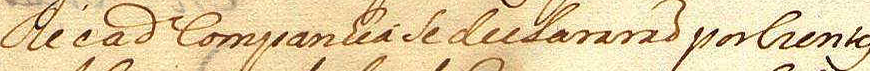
Re e a d̄ companhia se declararaõ por crentes
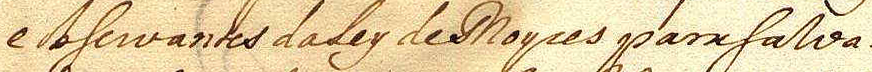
e observantes da Ley de Moyzes para salva
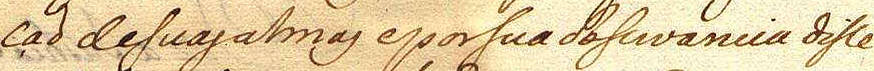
çaõ de suas almas e por sua observancia disse
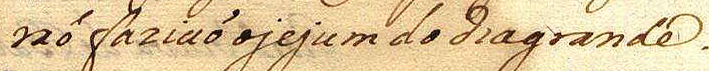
raõ faziaõ o jejum do dia grande.
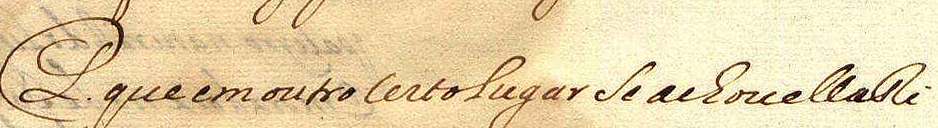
P. que em outro certo Lugar se achou ella Ré
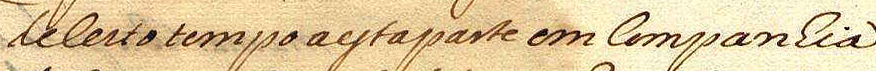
de certo tempo a esta parte em companhia
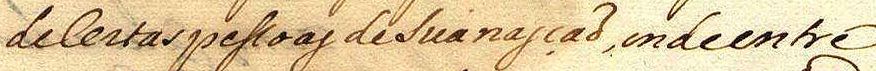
de certas pessoas de sua nasçaõ, onde entre
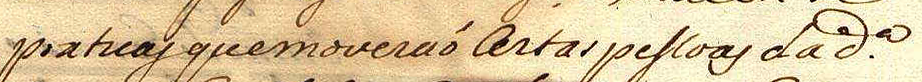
praticas que moveraõ certas pessoas da d.a
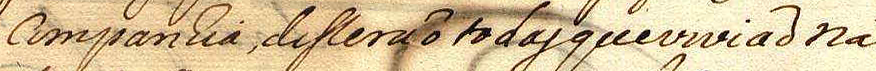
companhia, disseraõ todas que viviaõ na
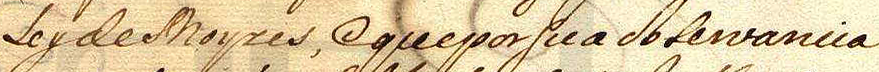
Ley de Moyzes, e que por sua observancia
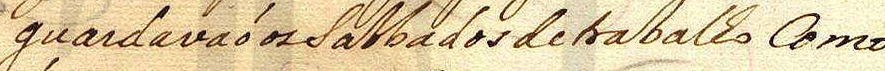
guardavaõ os Sabbados de trabalho como
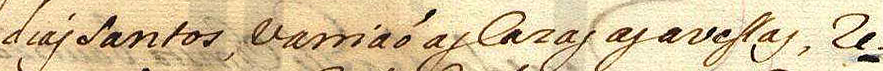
dias santos, varriaõ as cazas as avessas, Re
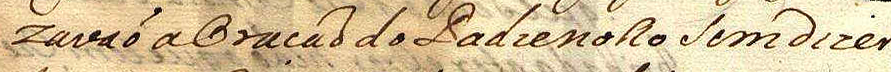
zavaõ a Oraçaõ do Padre nosso sem dizer
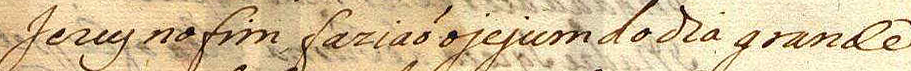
Jezus no fim, faziaõ o jejum do dia grande
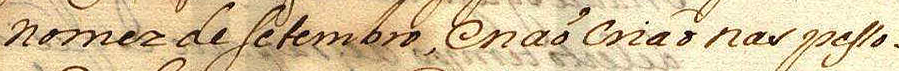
no mez de setembro, e naõ criaõ nas pesso
